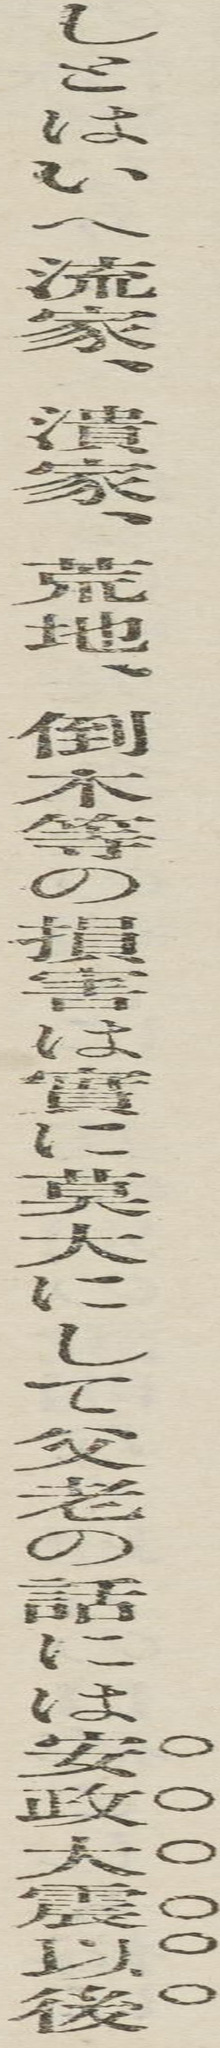しとはいへ流家、潰家、荒地、倒木等の損害は実に莫大にして父老の話には安政大震以後

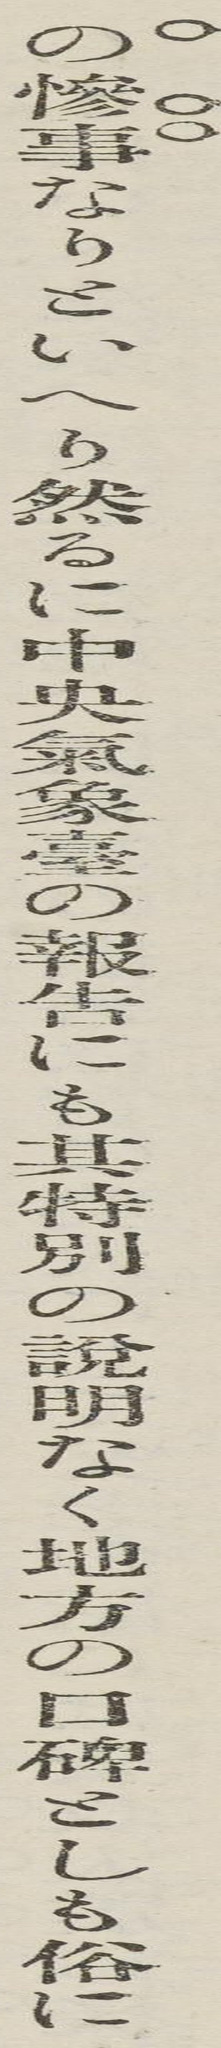の惨事〇〇〇なりといへり然るに中央気象台の報告にも其特別の説明なく地方の口碑としも俗に
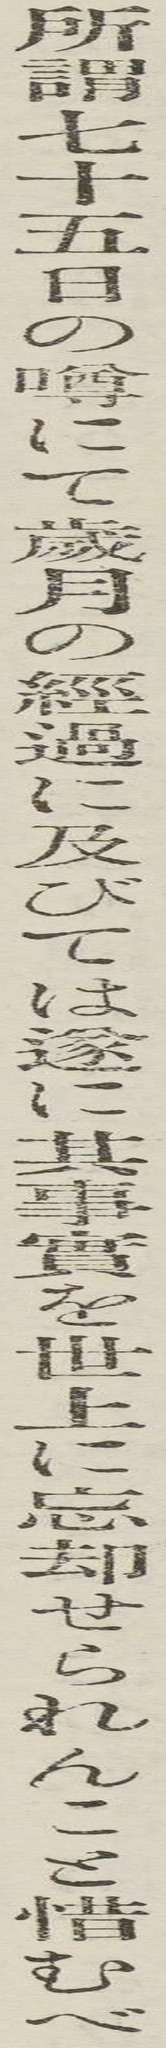所謂七十五日の噂にて歳月の経過の及びては遂に其事実を世上に忘却せられんこと惜むべ
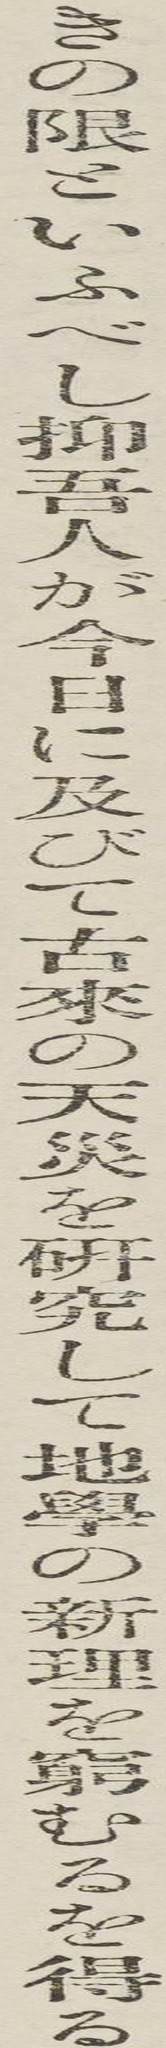きの限といふべし抑吾人が今日に及びて古来の天災を研究して地学の新理を窮むるを得る
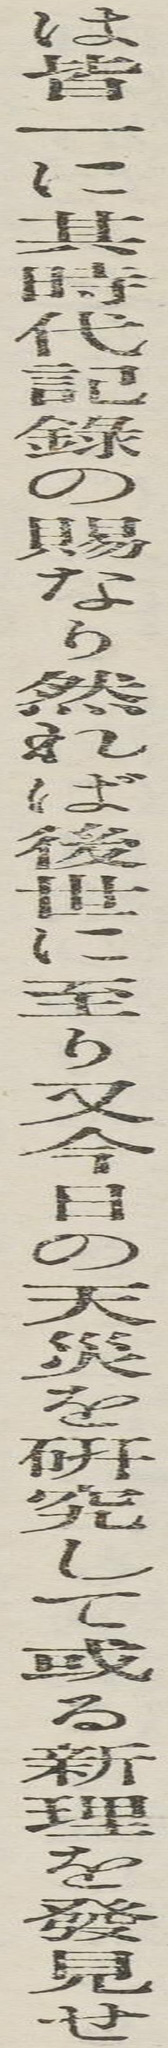は皆一に其時代記録の賜なり然れば後世に至り又今日の天災を研究して或る新理を発見せ
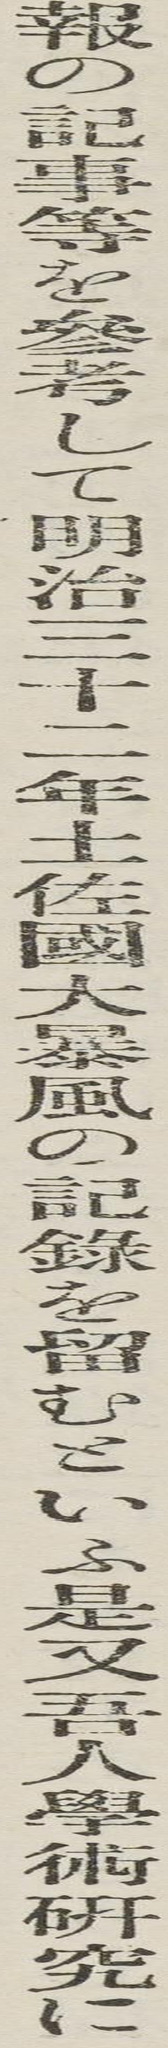報の記事等を参考して明治三十二年土佐国大暴風の記録を留むといふ是又吾人学術研究に
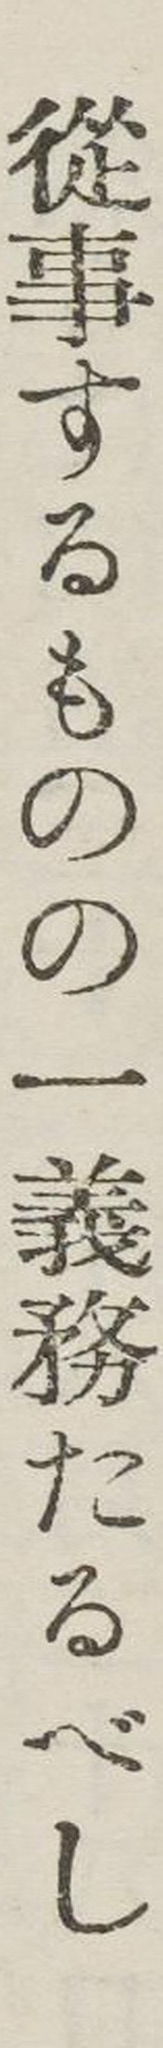従事するものの一義務たるべし
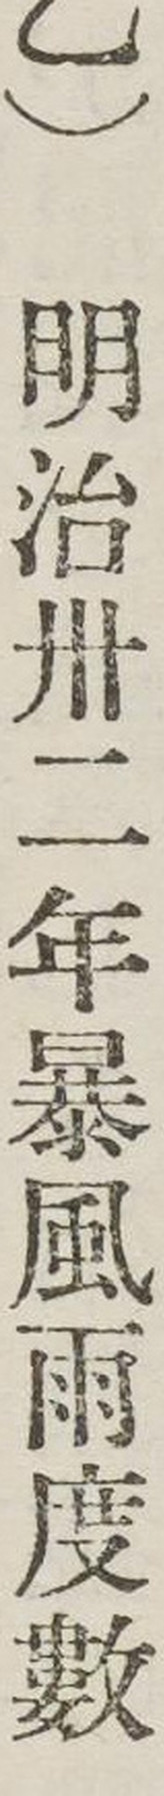明治卅二年暴風雨度数
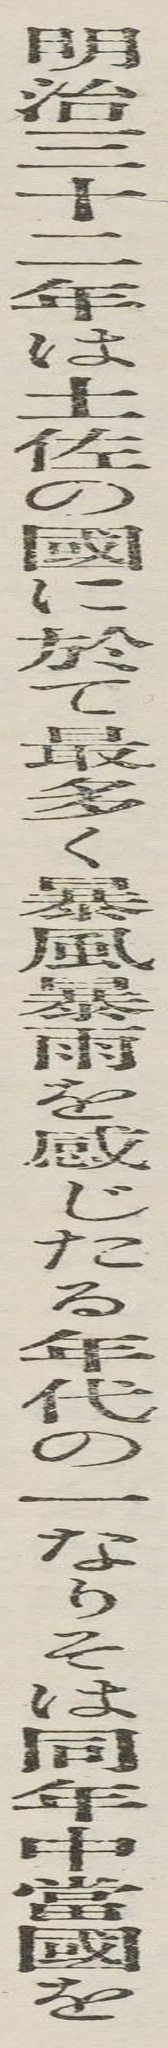明治三十二年は土佐の国に於て最多く暴風雨を感じたる年代の一なりそは同年中当国を
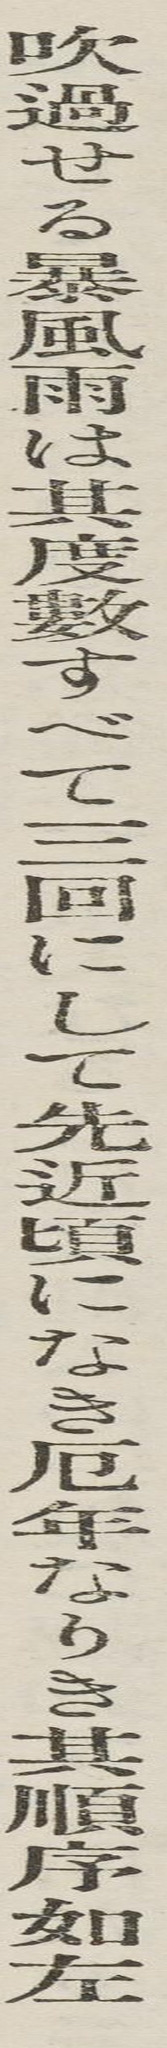吹過せる暴風雨は其度数すべて三回にして先近頃になき厄年なりき其順序如左
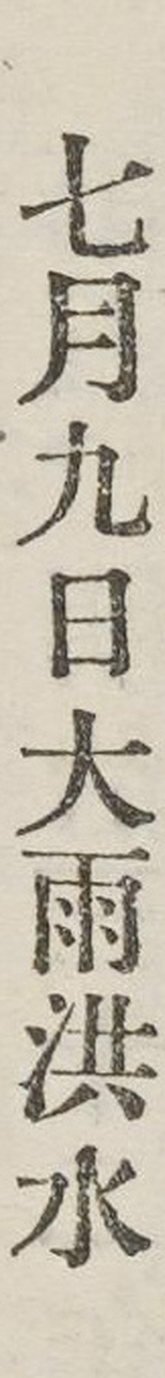七月九日大雨洪水
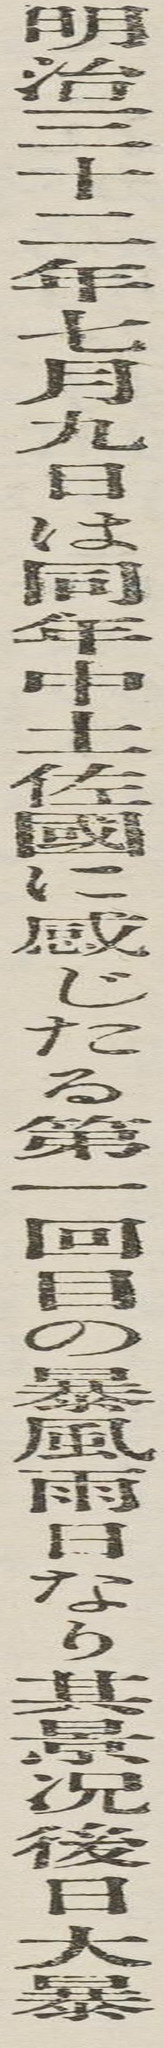明治三十二年七月九日は同年中土佐国に感じたる第一回目の暴風雨日なり其景況後日大暴
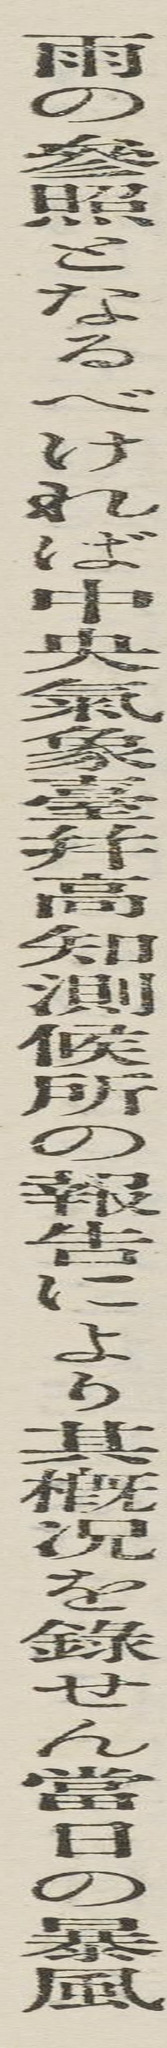雨の参照となるべければ中央気象台幷高知測候所の報告により其概況を録せん当日の暴風
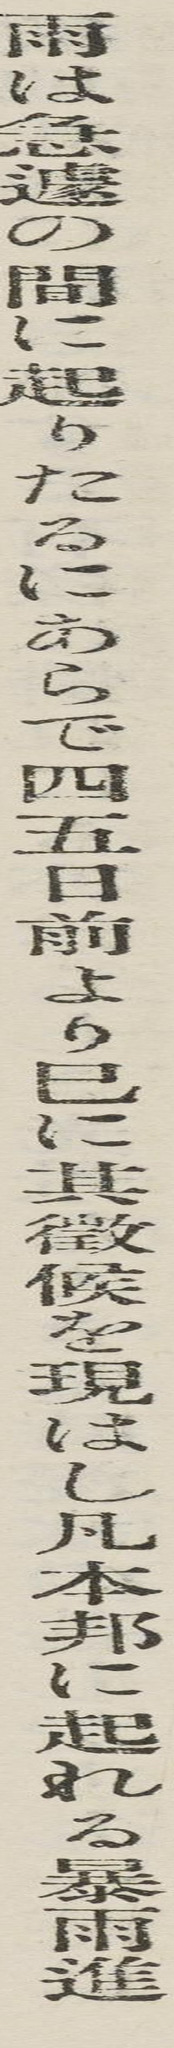雨は急遽の間に起りたるにあらで四五日前より已に其徴候を現はし凡本邦に起れる暴雨進
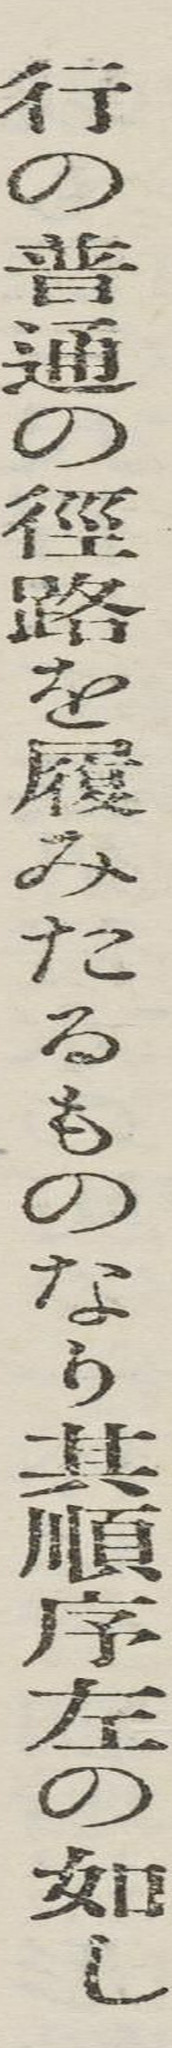行の普通の経路を履みたるものなり其順序左の如し
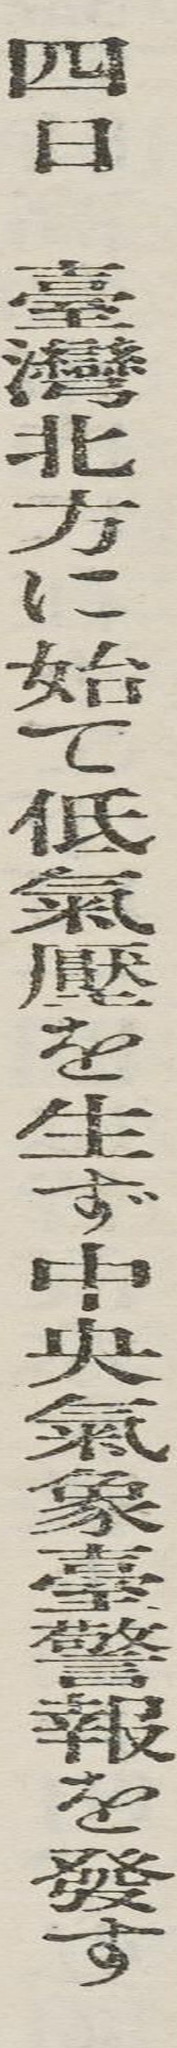四日台湾北方に始て低気圧を生ず中央気象台警報を発す
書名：土佐古今ノ地震
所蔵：東京大学地震研究所図書室 Earthquake Research Institute Library, The University of Tokyo, JAPAN
